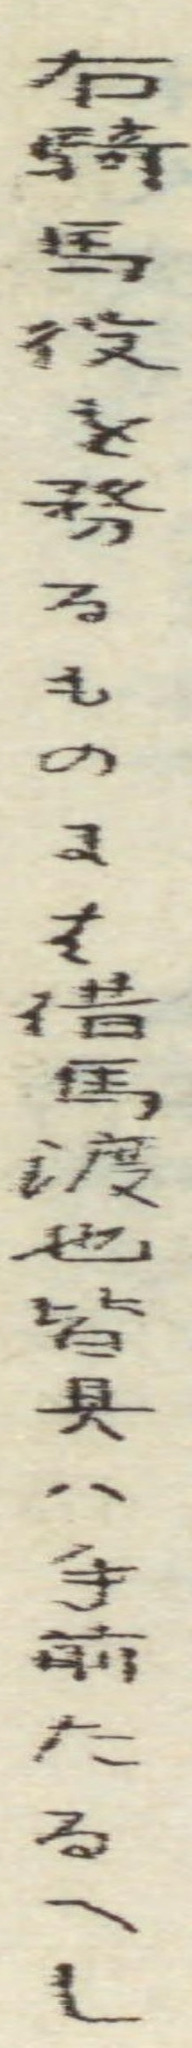右騎馬役を務るものは借馬渡也皆具ハ手前たるへし
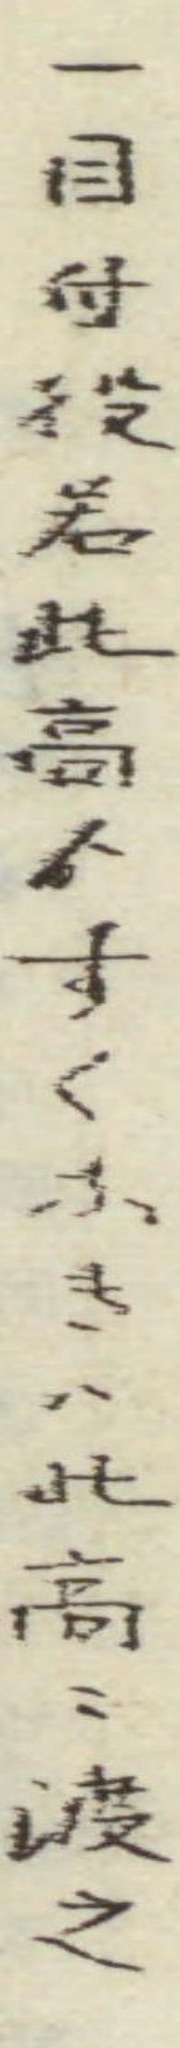一目付役若此高ゟすくなきハ此高二渡之
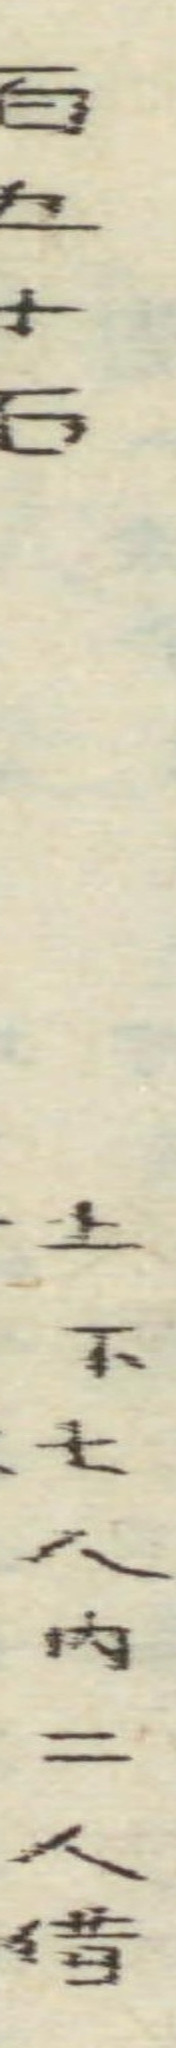百五十石上下七人内二人借
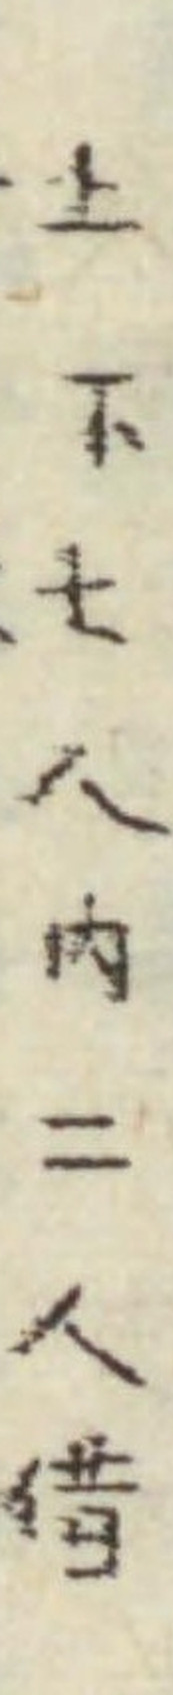上下六人内二人借
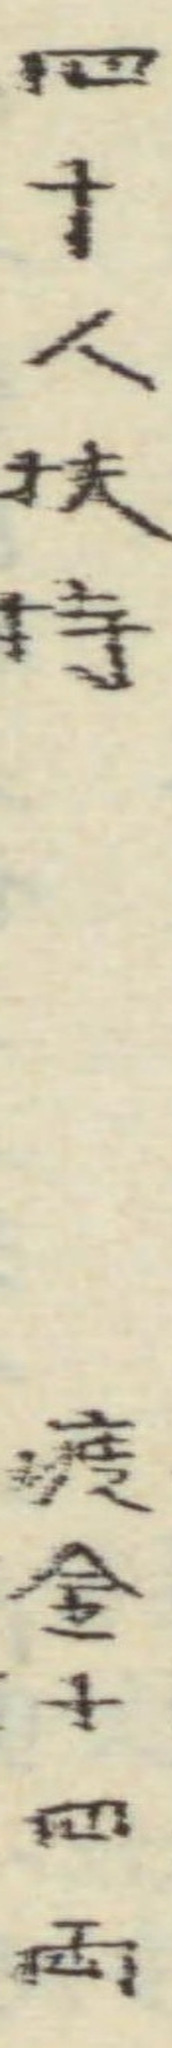四十人扶持渡金十四両
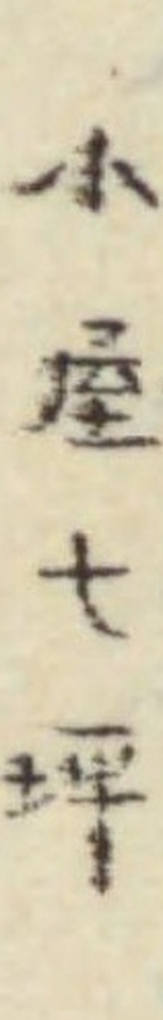小屋九坪
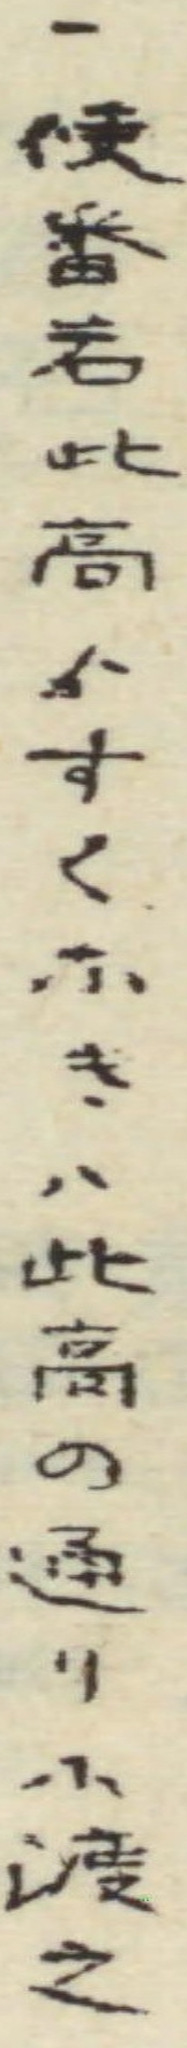一使番若此高ゟすくなきハ此高の通りに渡之
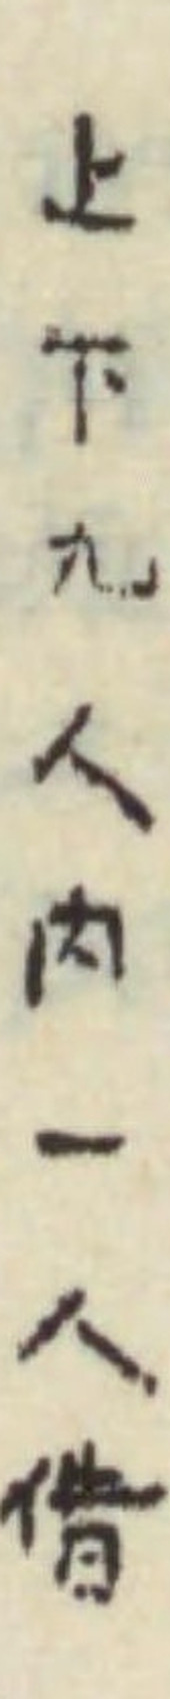上下九人内一人借
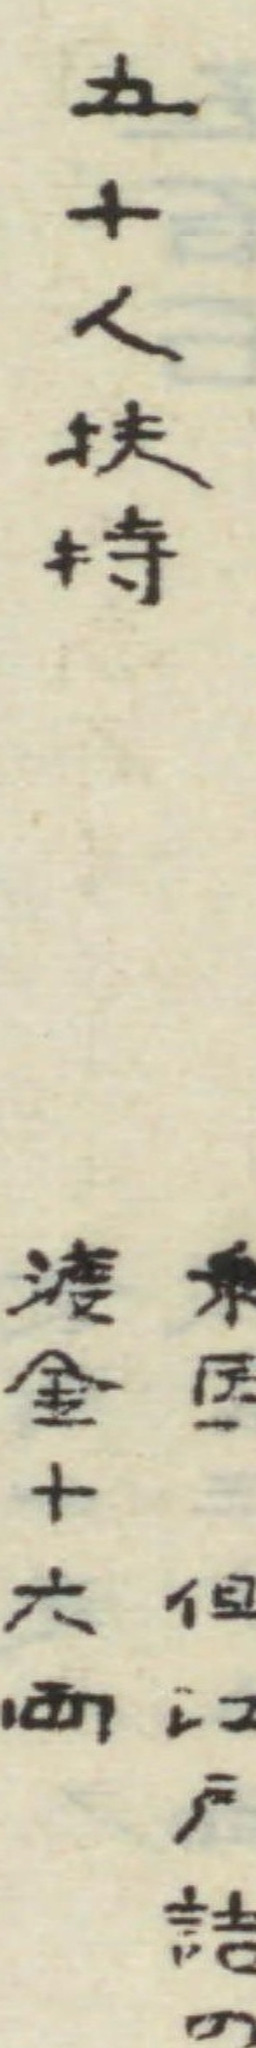五十人扶持渡金十六両
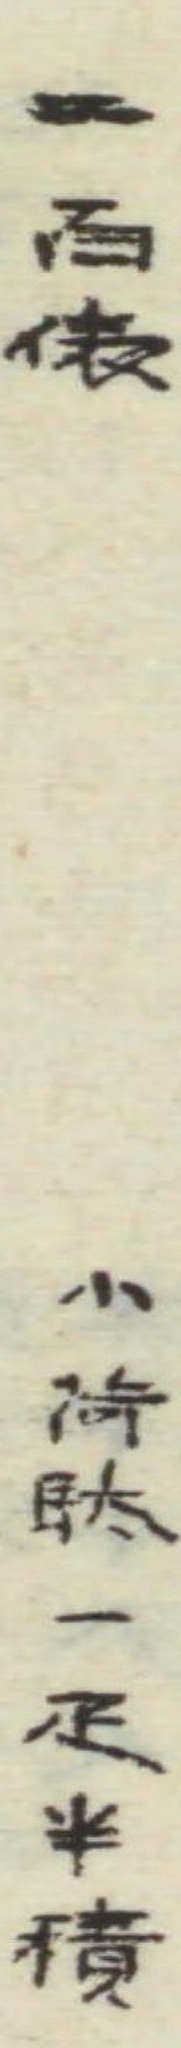二百俵小荷駄一疋半積
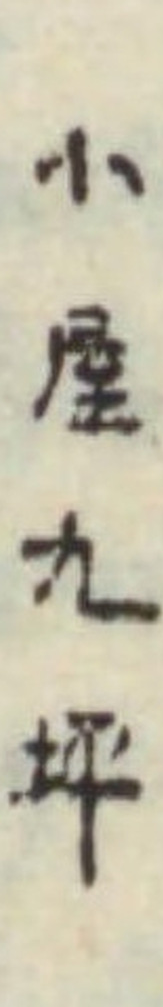小屋九坪
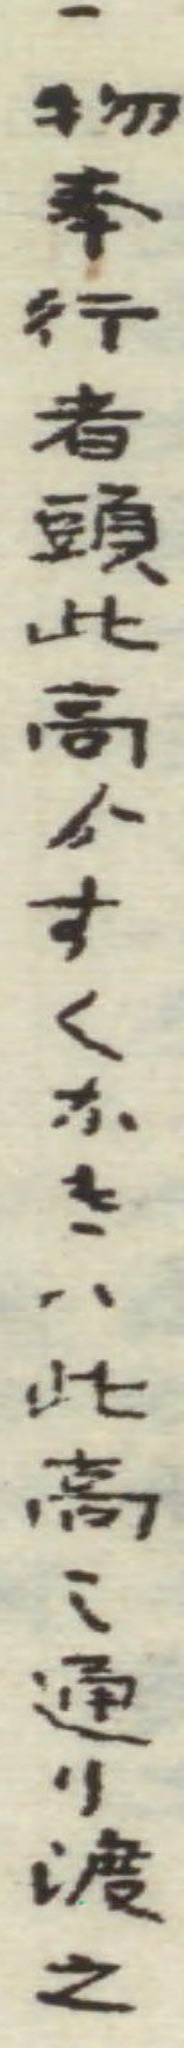一物奉行者頭此の高ゟすくなきハ此高之通り渡之
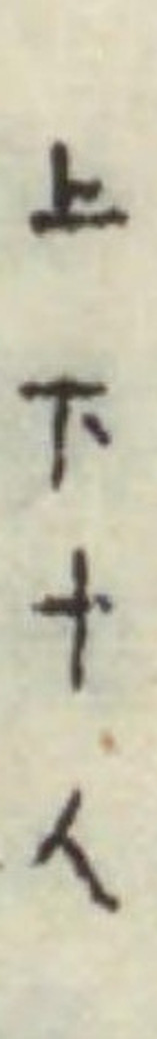上下十人
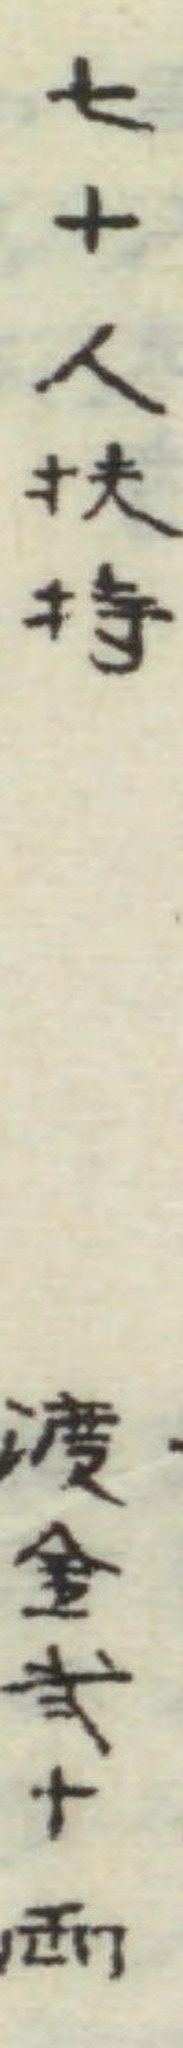七十人扶持渡金弐十両
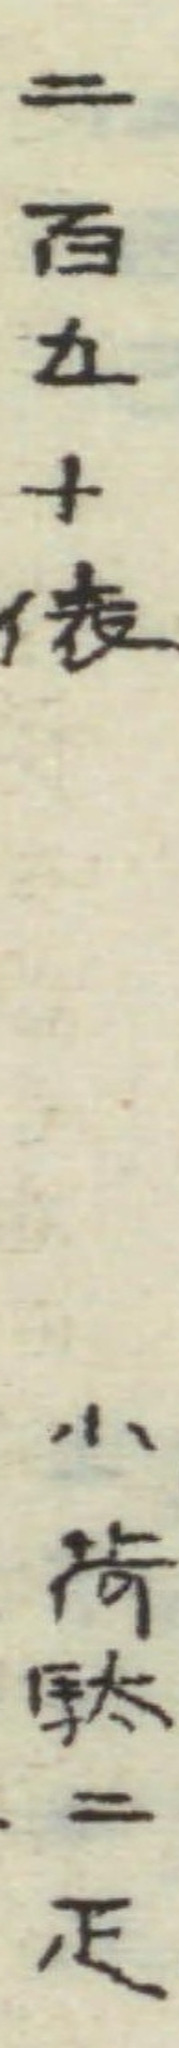二百五十俵小荷駄二疋
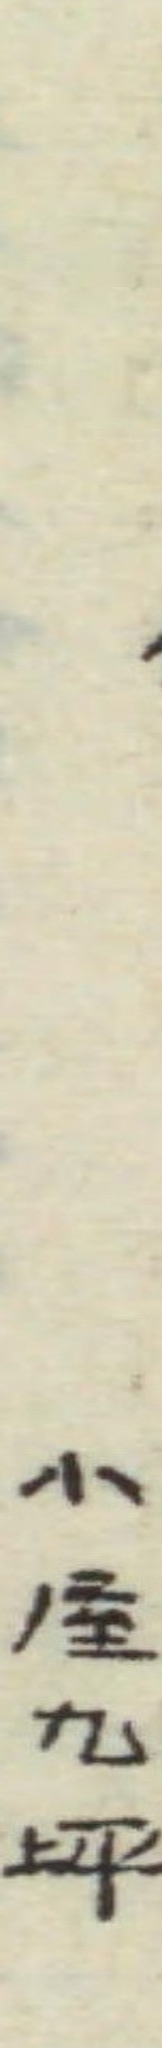小屋九坪
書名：三河吉田藩動員史料
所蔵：国立国会図書館 National Diet Library, JAPAN
